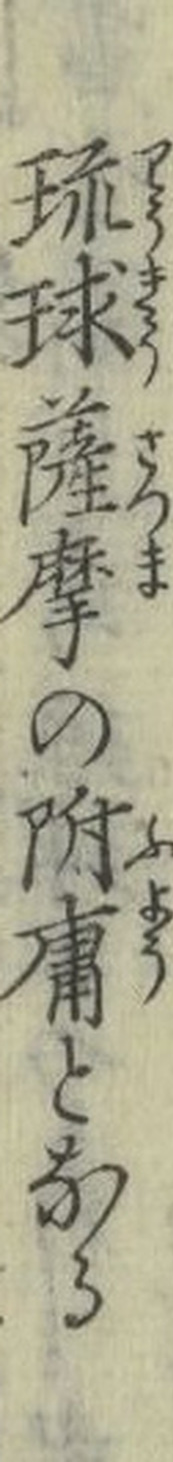琉球薩摩の附庸となる
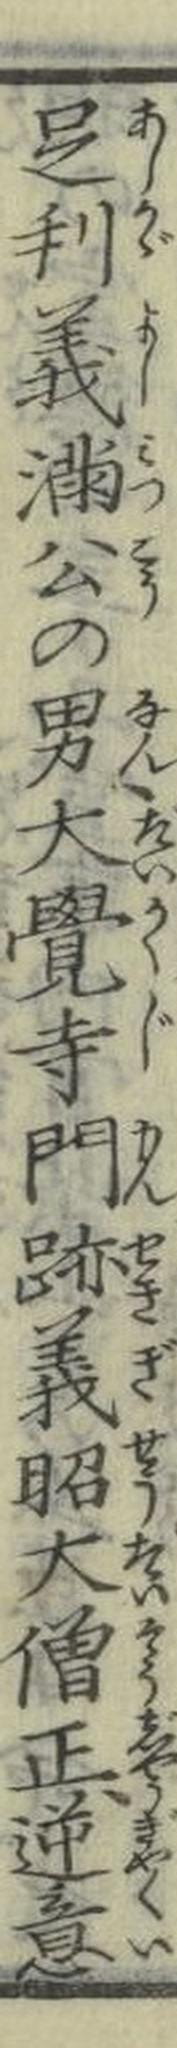足利義満公の男、大覚寺門跡義昭大僧正、逆意
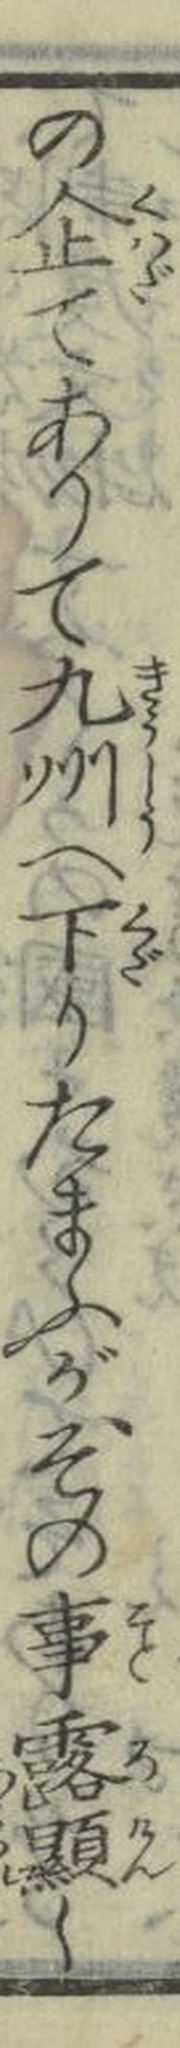の企てありて九州へ下りたまふが、その事露顕し
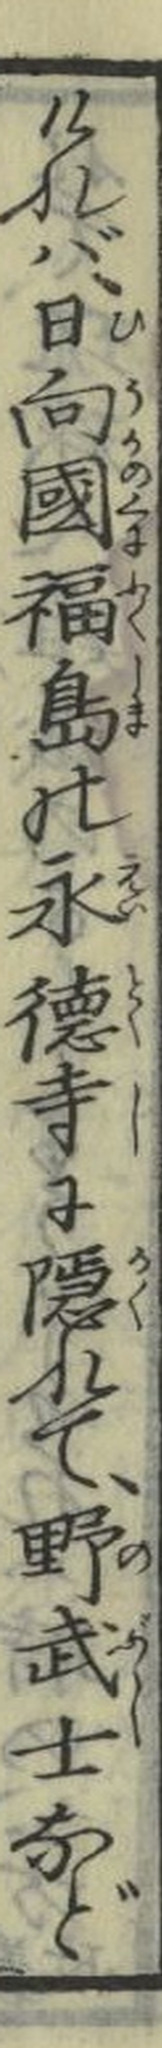ければ、日向国福島の永徳寺に隠れて、野武士など
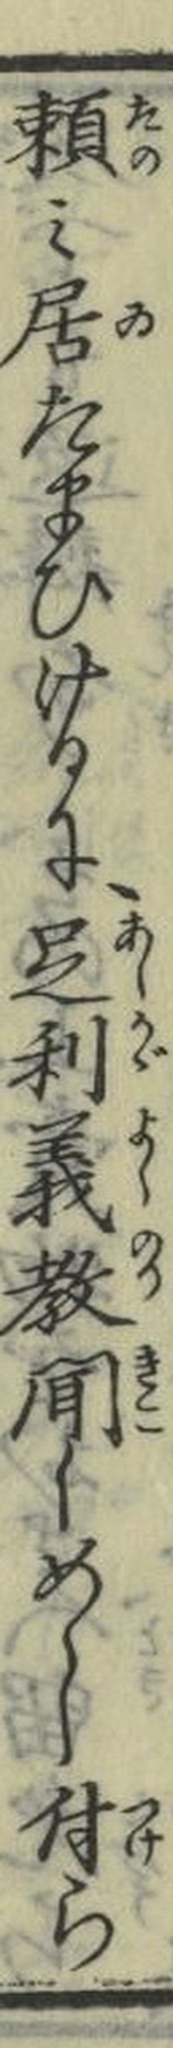頼み居たまひけるに、足利義教聞しめし付ら
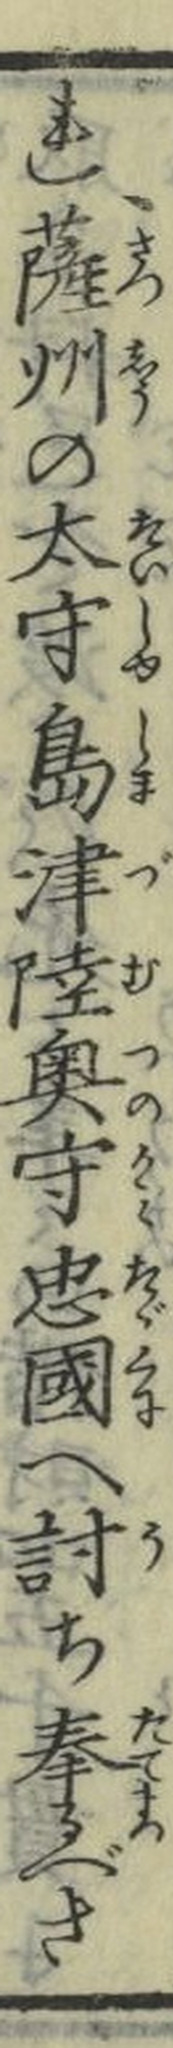れ、薩州の太守島津陸奥守忠国へ討ち奉るべき
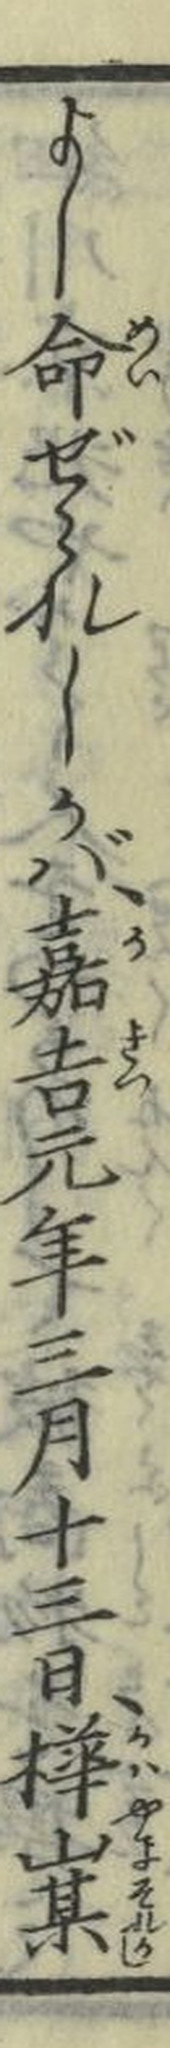よし命ぜられしかば、嘉吉元年三月十三日、樺山某
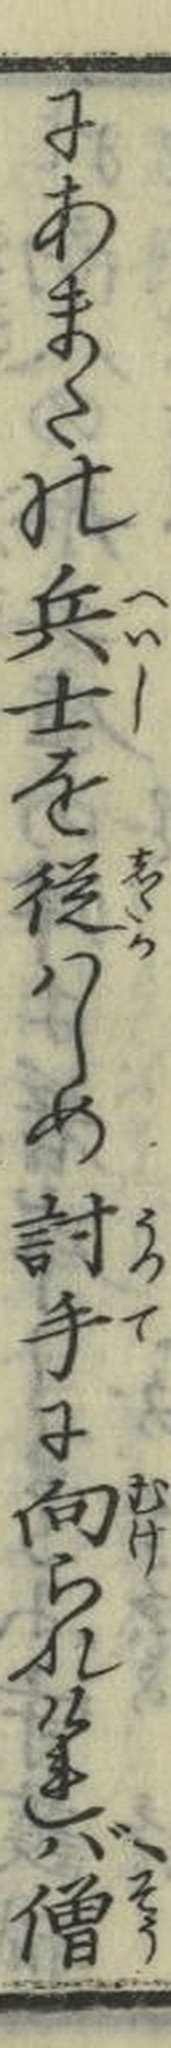にあまたの兵士を従はしめ討手に向られければ、僧
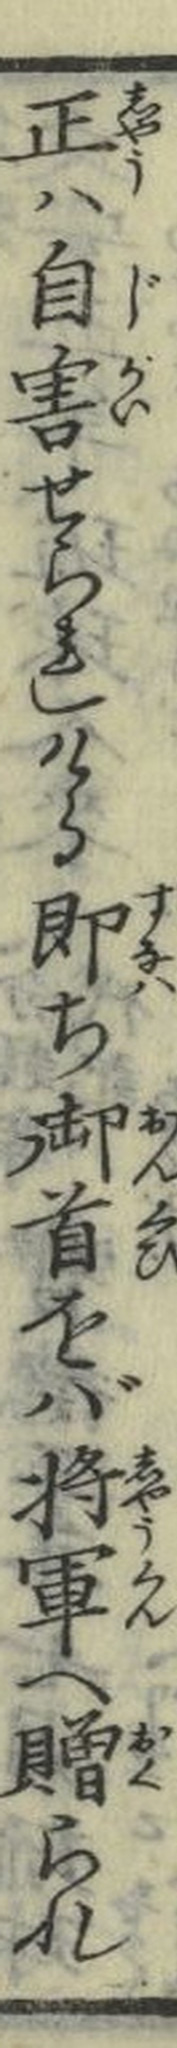正は自害せられける即ち御首をば将軍へ贈られ
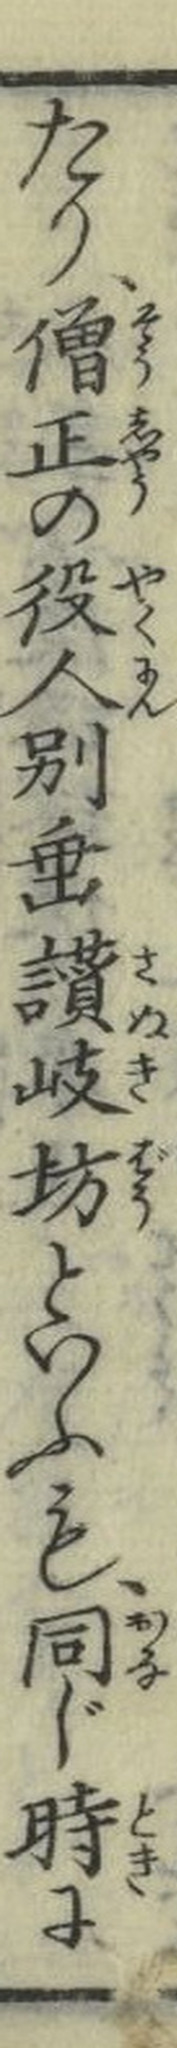たり、僧正の役人別垂讃岐坊といふもの、同じ時に
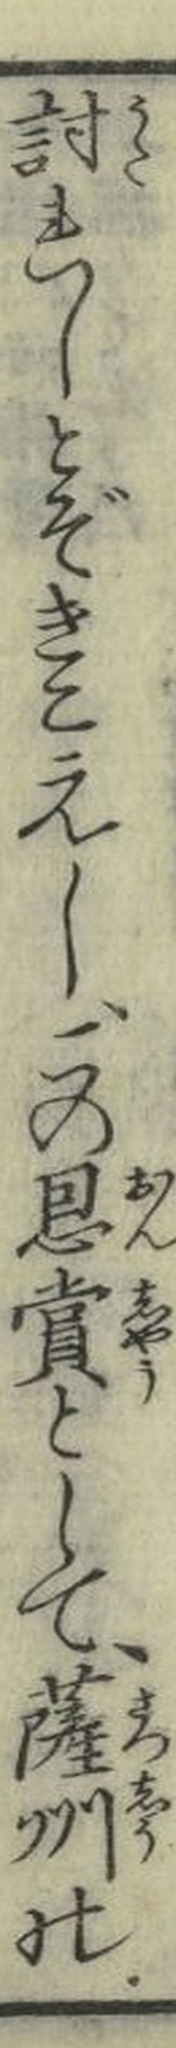討れしとぞきこえし、この恩賞として、薩州の
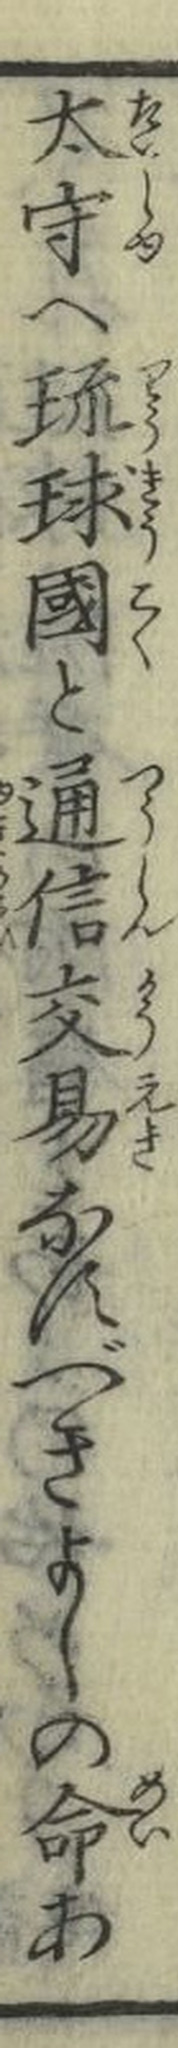太守へ琉球国と通信交易なすべきよしの命あ

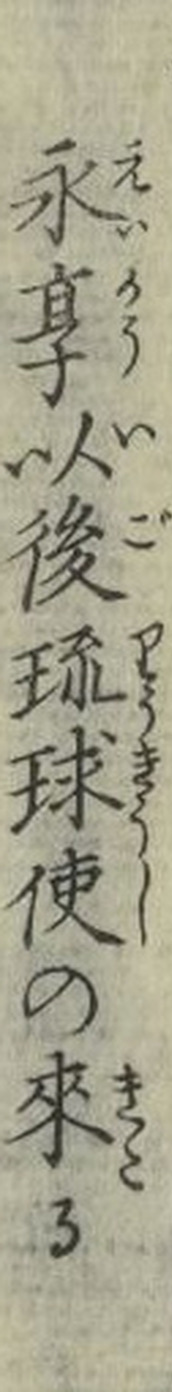永享以後琉球使の来る
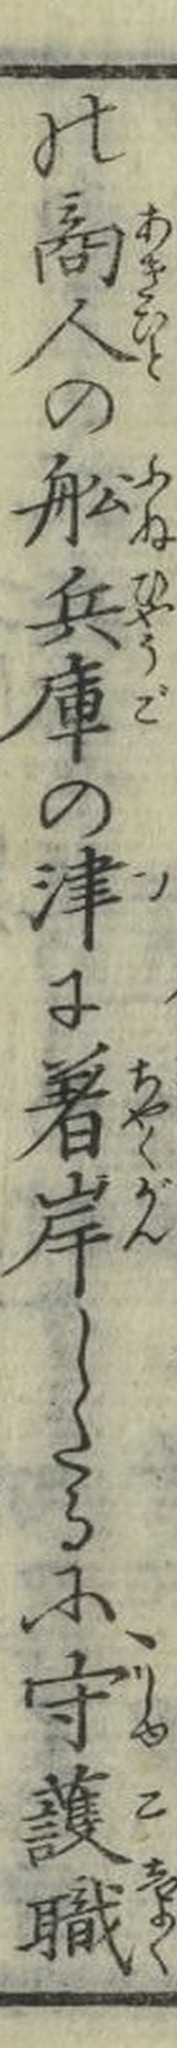の商人の船兵庫の津に着岸したるに、守護職
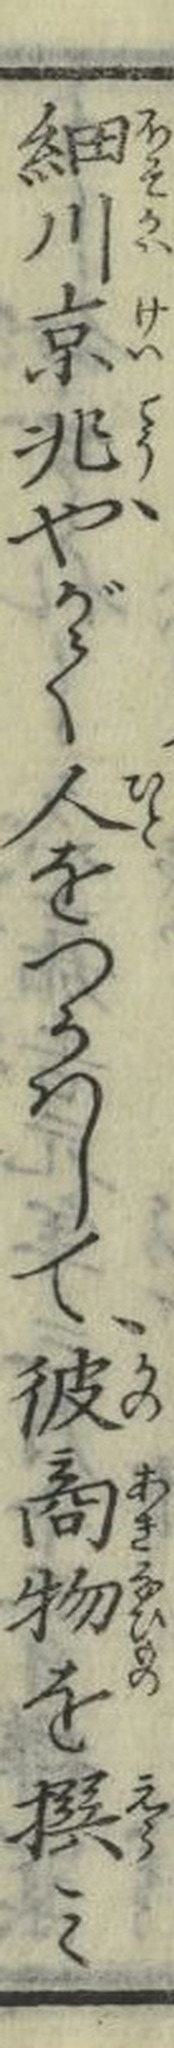細川京兆、やがて人をつかはして、彼商物を撰み
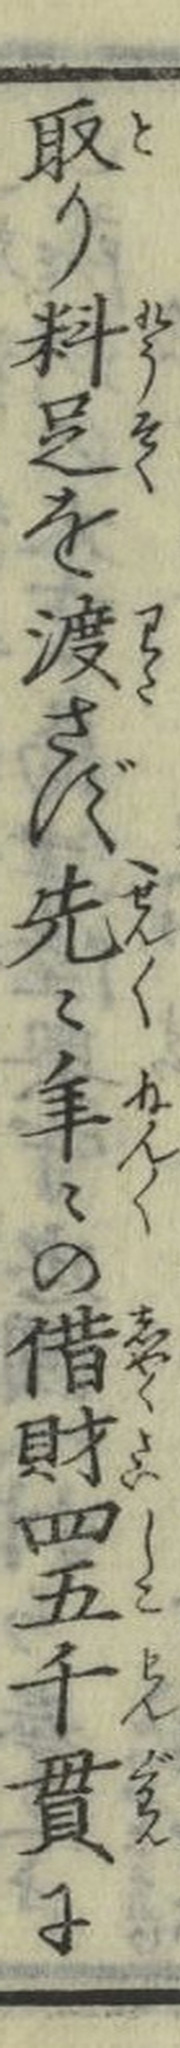取り料足を渡さず、先々年々の借財四五千貫に
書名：琉球入貢紀畧
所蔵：University of the Ryukyus Library
